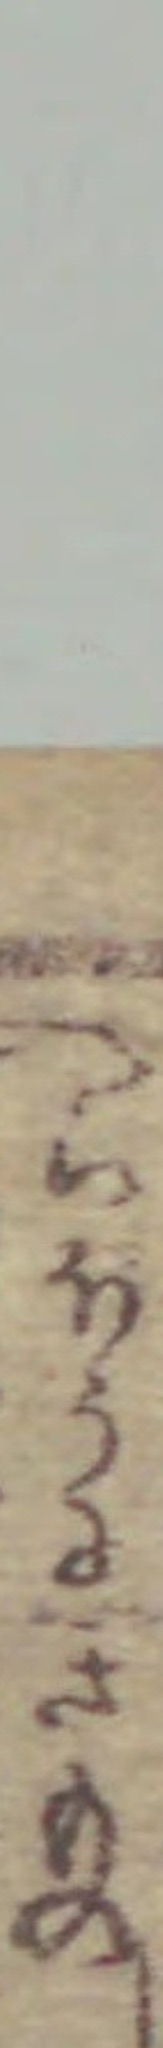へらほうにきもの
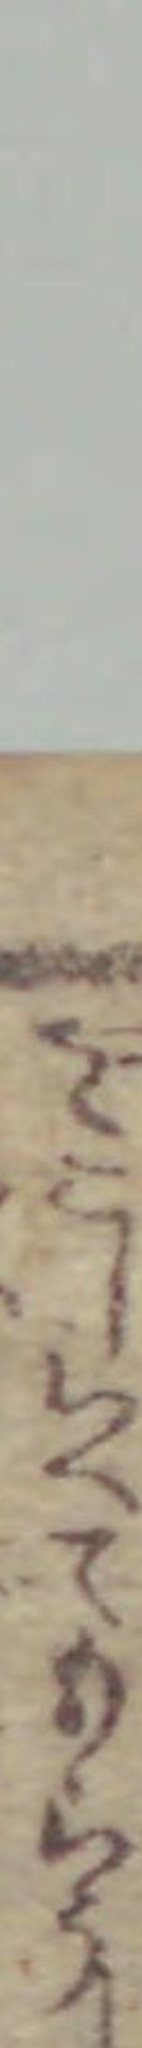をこしらへてもらう
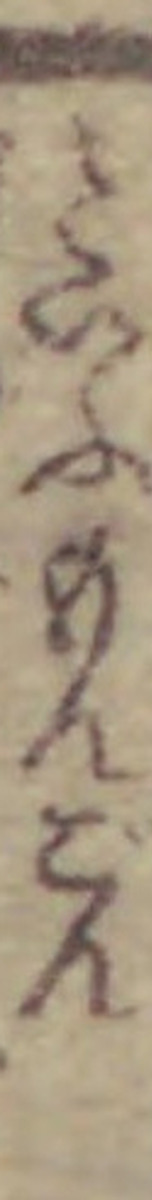といふもんごん
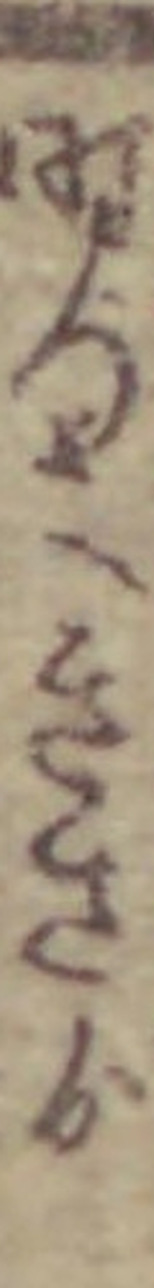時さまへきさゟ
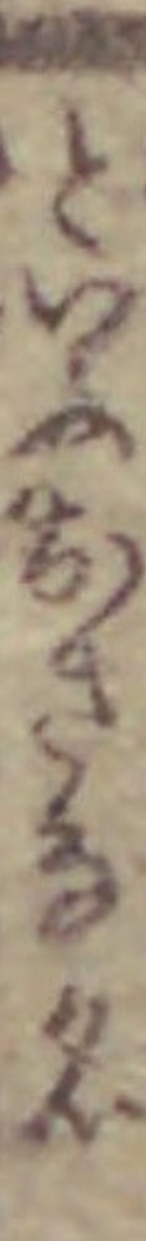といふおさな名
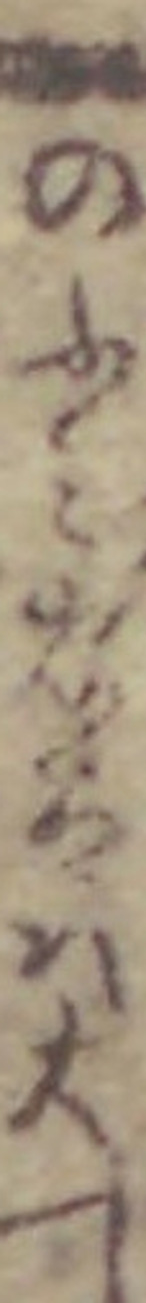のふみ忠太は大
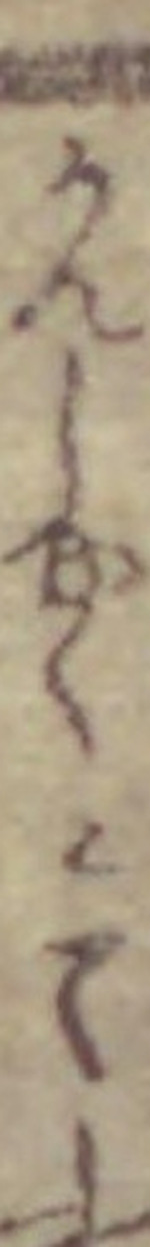かんしやくにて
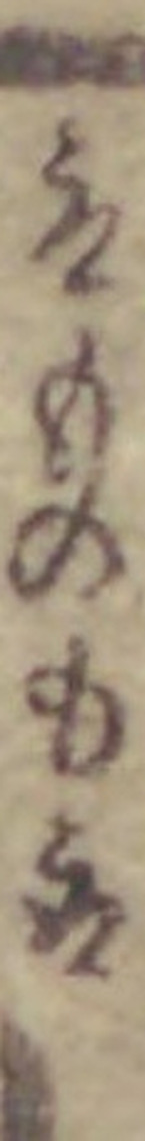取ものも取
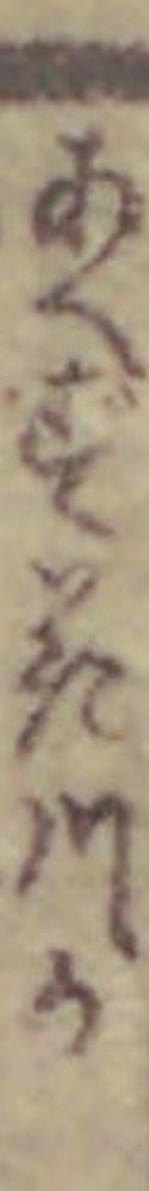あへず花川か
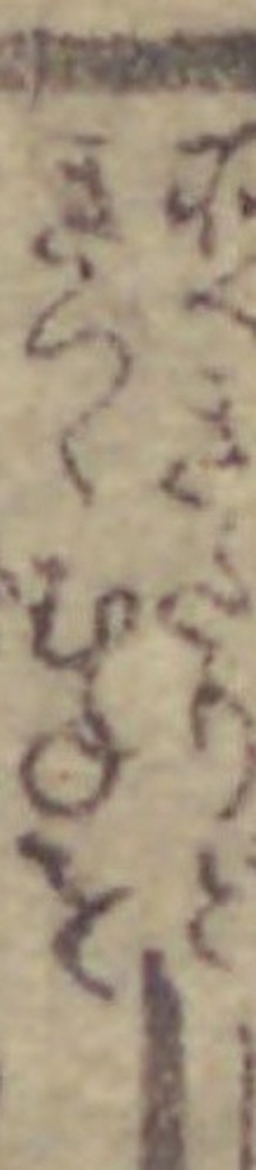きつくむねを
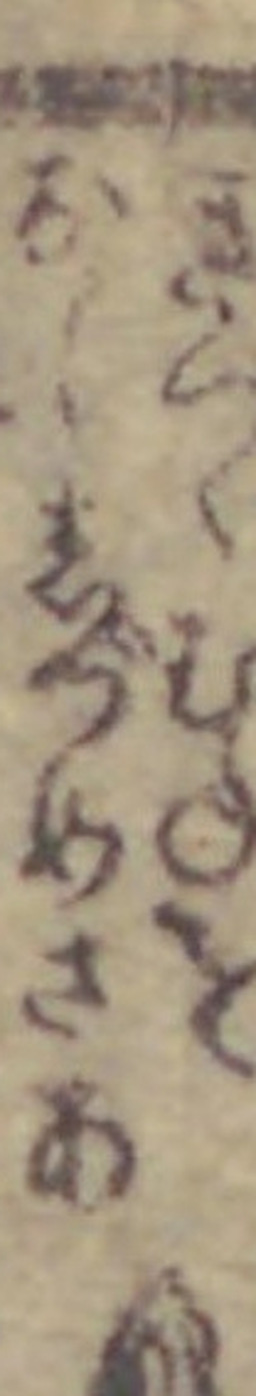おししづめさあ
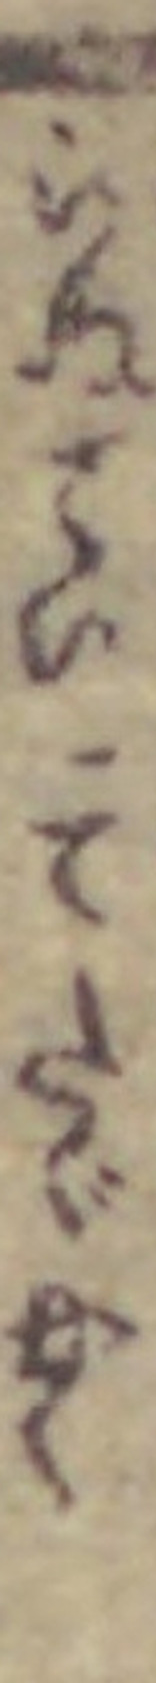らぬていにてたゞやく
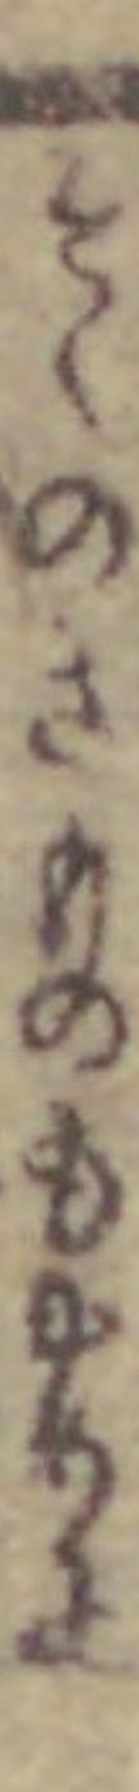そくのきものもやめに
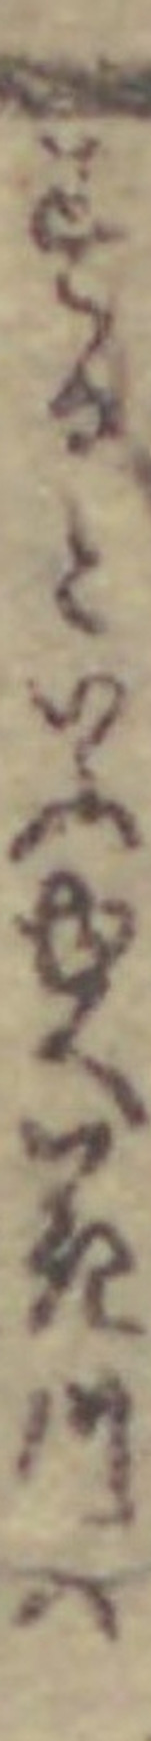するといふゆへ花川は
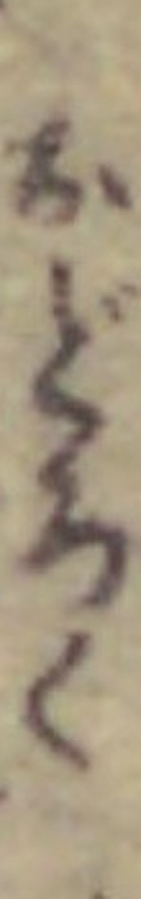おどろく
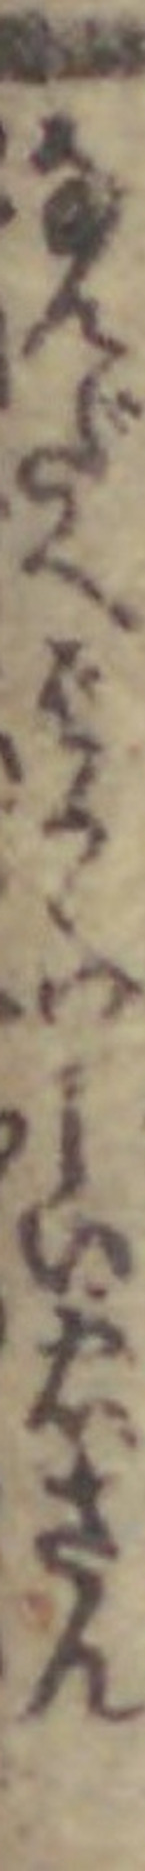なんだへばからしい忠さん
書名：間似合嘘言曽我 3巻
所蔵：国立国会図書館 National Diet Library, JAPAN
